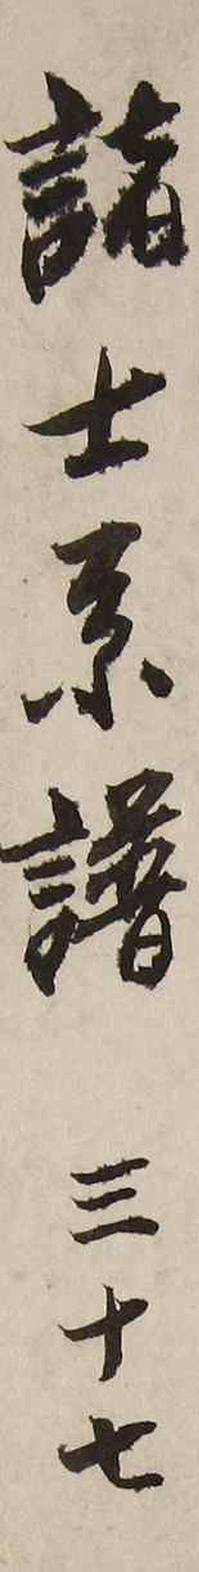諸士系譜三十七
